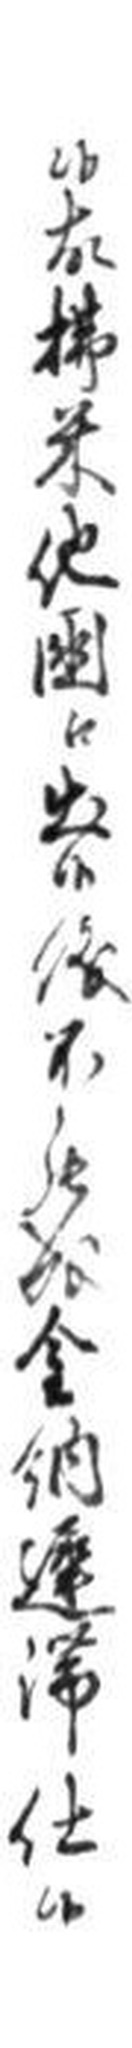候故払米他国江出候儀不罷成金納遅滞仕候
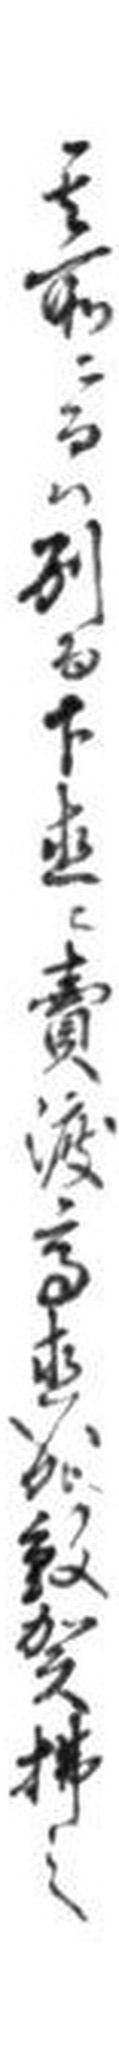其所ニ而ハ別而下直ニ売渡高直成敦賀払之
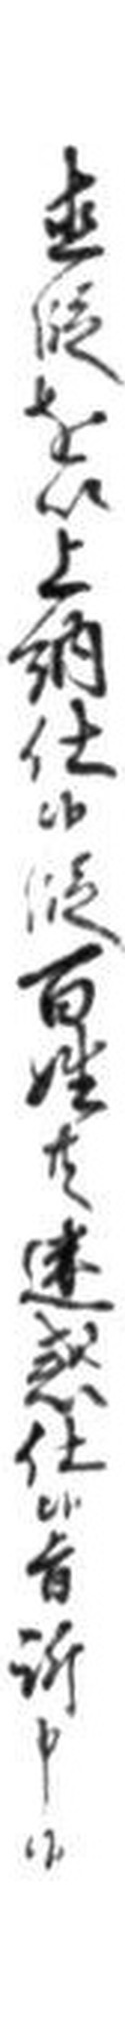直段を以上納仕候段百姓共迷惑仕候旨訴申候
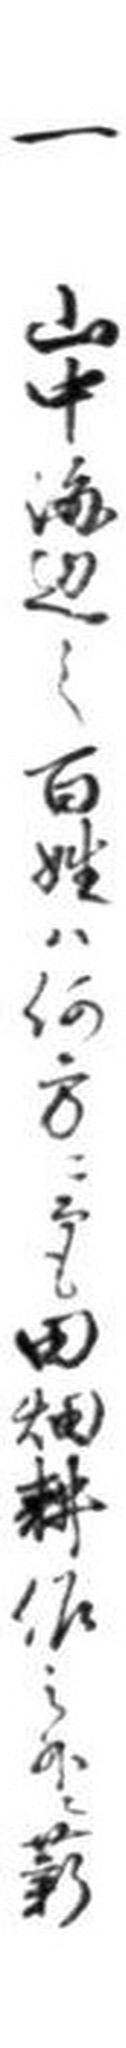一山中海辺之百姓ハ何方ニ而も田畑耕作之外ニ薪
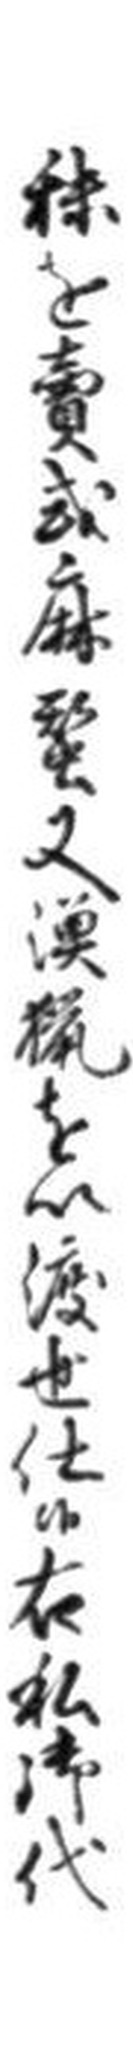秣を売或麻蚕又漁猟を以渡世仕候右私御代
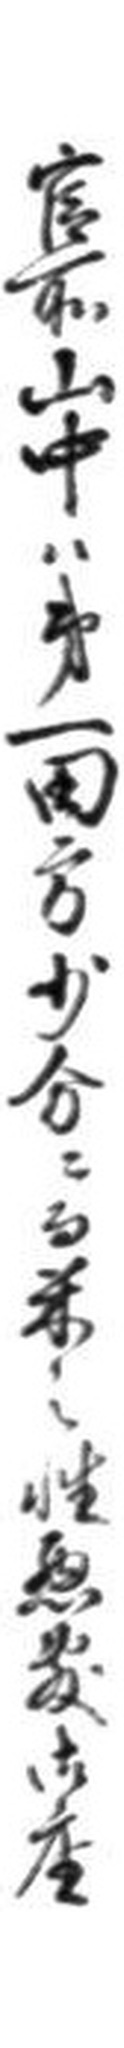官所山中ハ第一田方少分ニ而米之性悪敷御座
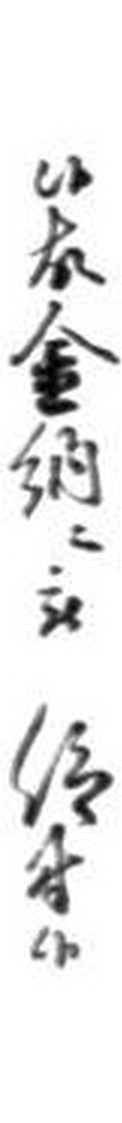候故金納ニ被仰付候
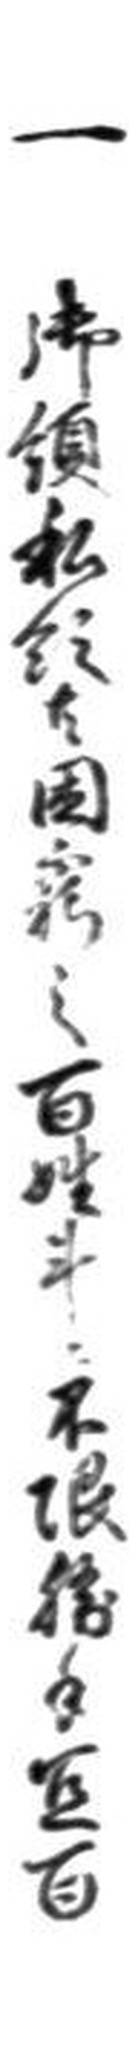一御領私領共困窮之百姓斗ニ不限勝手宜百
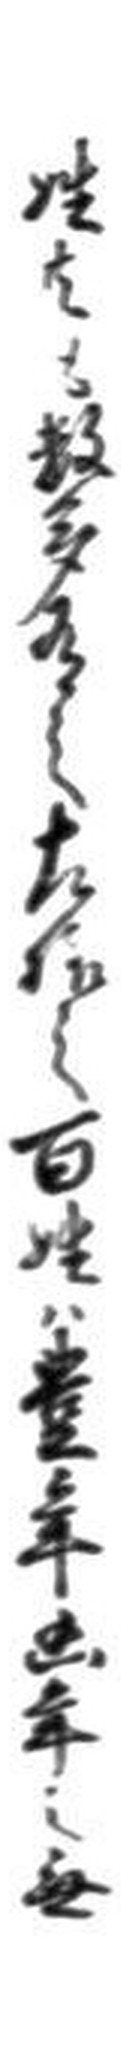姓共も数多有之左様之百姓ハ豊年凶年之無
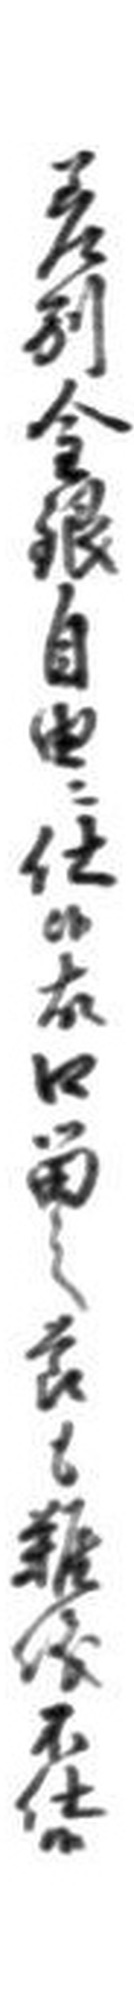差別金銀自由ニ仕候故口留之節も難儀不仕候
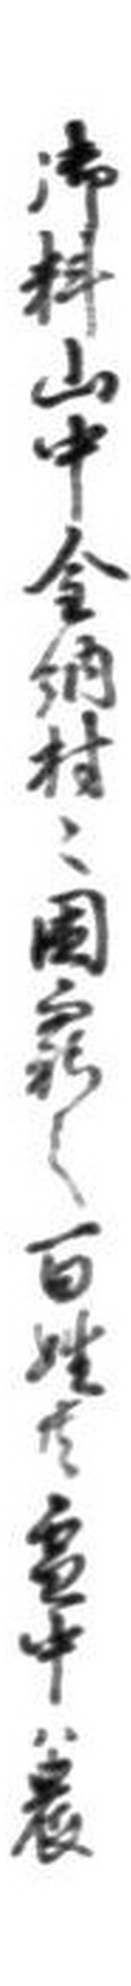御料山中金納村々困窮之百姓共雪中ハ農
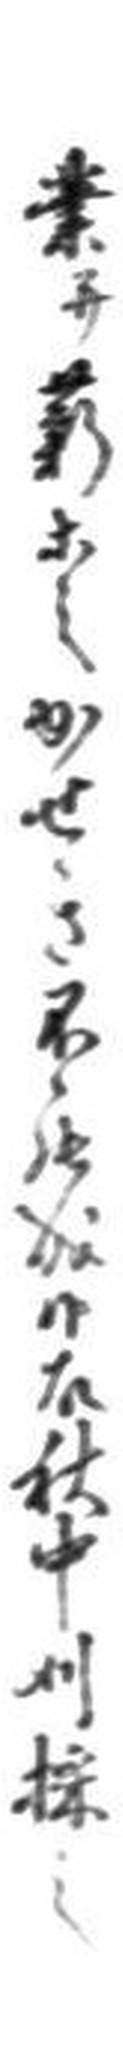業并薪等之かせき不罷成候故秋中刈採之
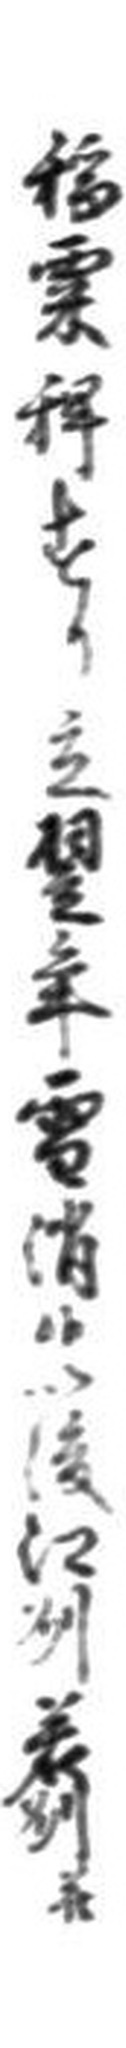稲粟稗すり立翌年雪消候以後江州若州并
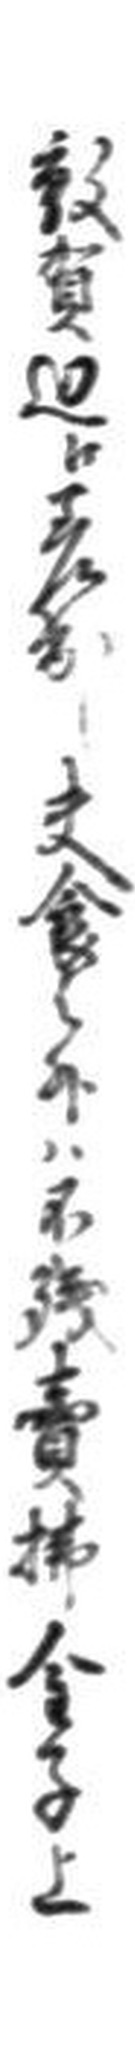敦賀辺江差出し夫食之外ハ不残売払金子上

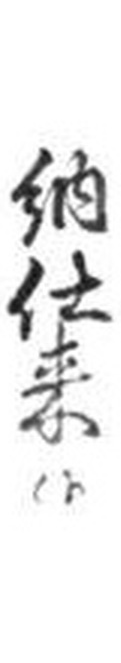納仕来候
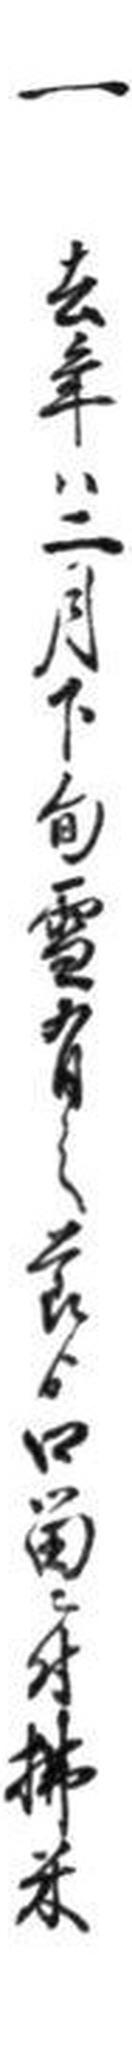一去年ハ二月下旬雪有之節ゟ口留ニ付払米
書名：家譜 二十二 吉品公 従元禄十五年到同十六年
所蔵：福井県文書館 Fukui Prefectural Archives
